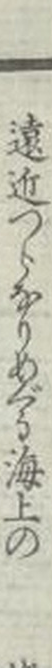遠近つらなりめぐる海上の
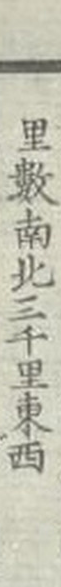里数南北三千里東西
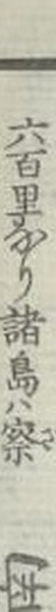六百里なり諸島は察
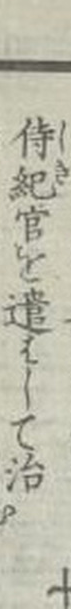侍紀官を遣はして治しむ
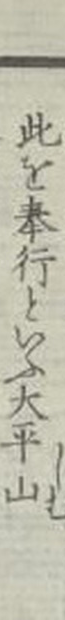此を奉行といふ大平山
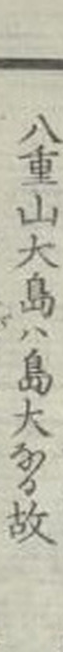八重山大島は島大なる故
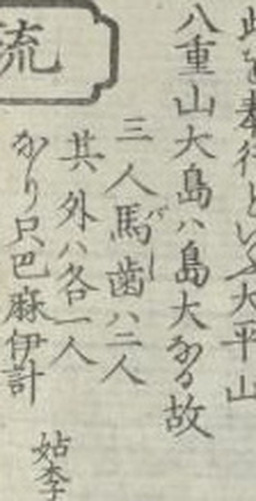三人馬歯は二人
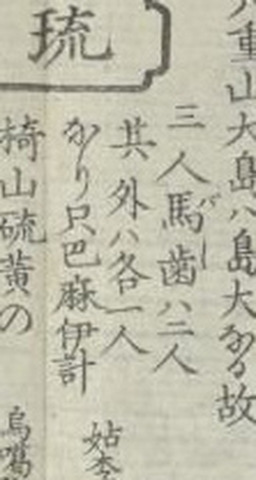其外は各一人
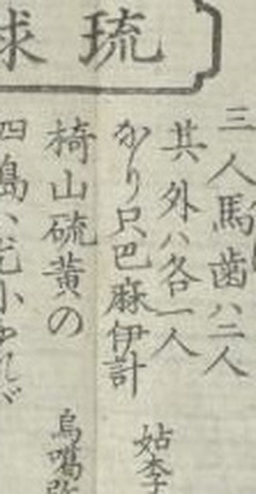なり只巴麻伊計
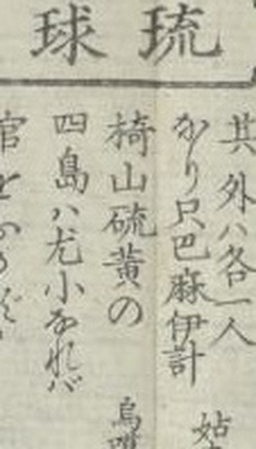椅山硫黄の
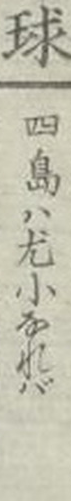四島は尤小なれば
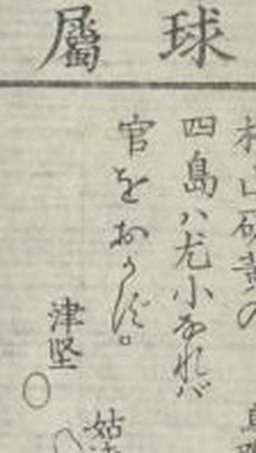官をおかず◇
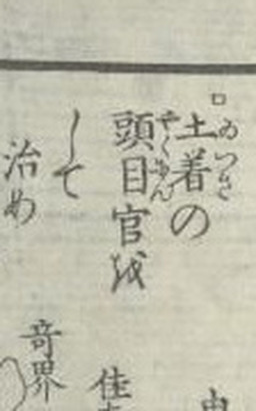頭目官を
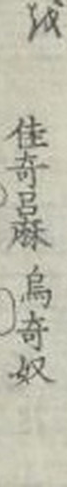佳奇呂麻烏奇奴
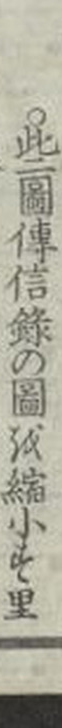○此二図伝信録の図を縮小す里
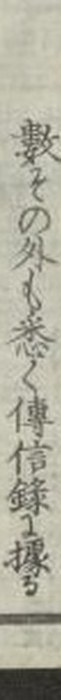数その外も悉く伝信録に拠る
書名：中山国使略
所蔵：University of the Ryukyus Library
